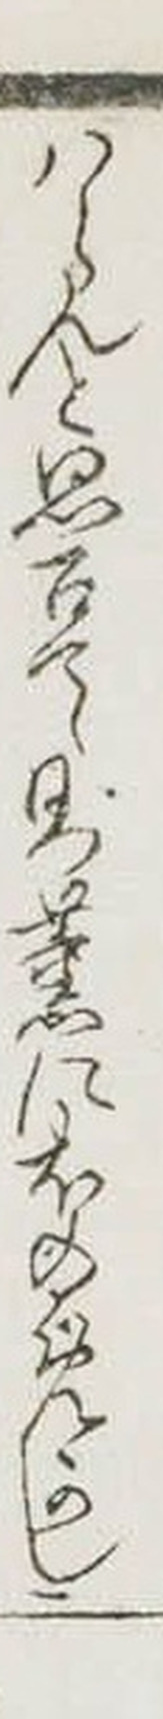はらんと思召て則薫にほのめかし
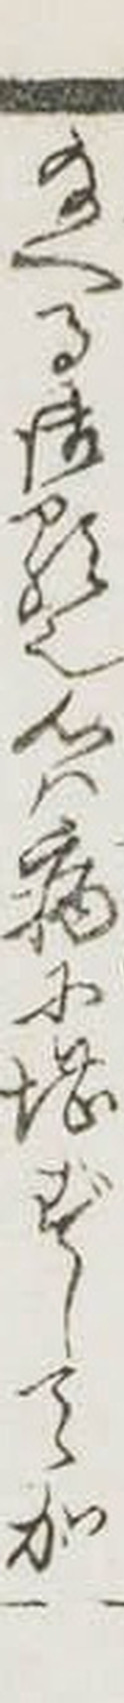給へる御願也心は病に堪ずしてか
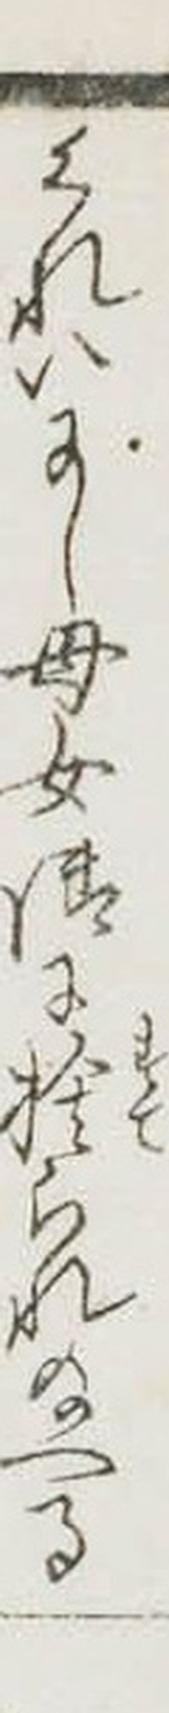くれいにし母女御に捨られ給へる
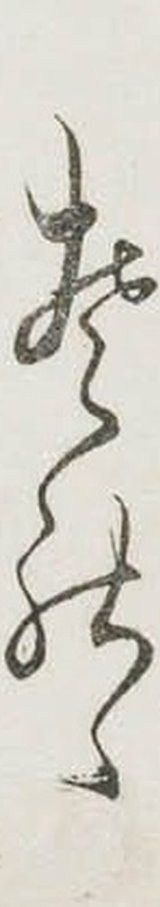そのゝ
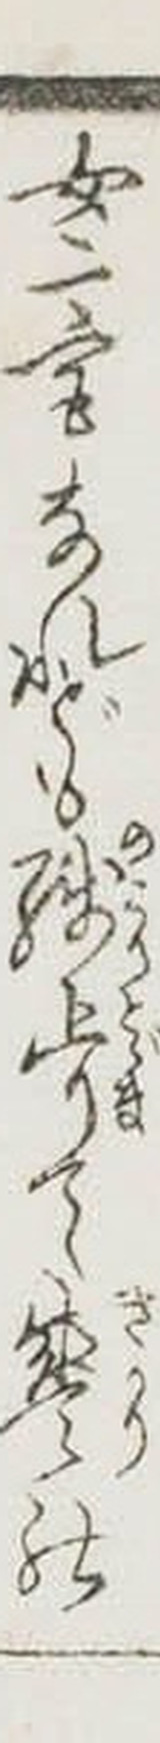女二宮なれども残止りて盛の
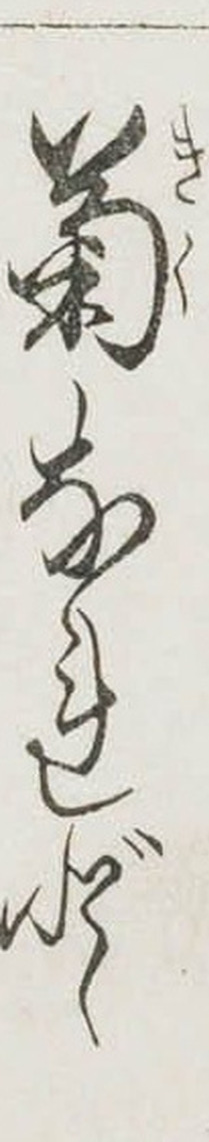菊なれど
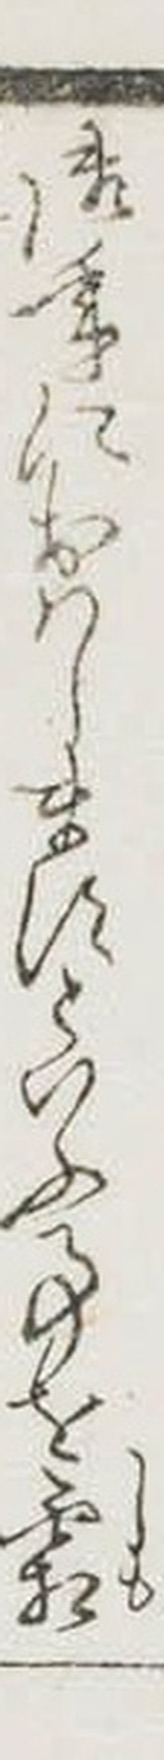御年におはしますといふ事を霜
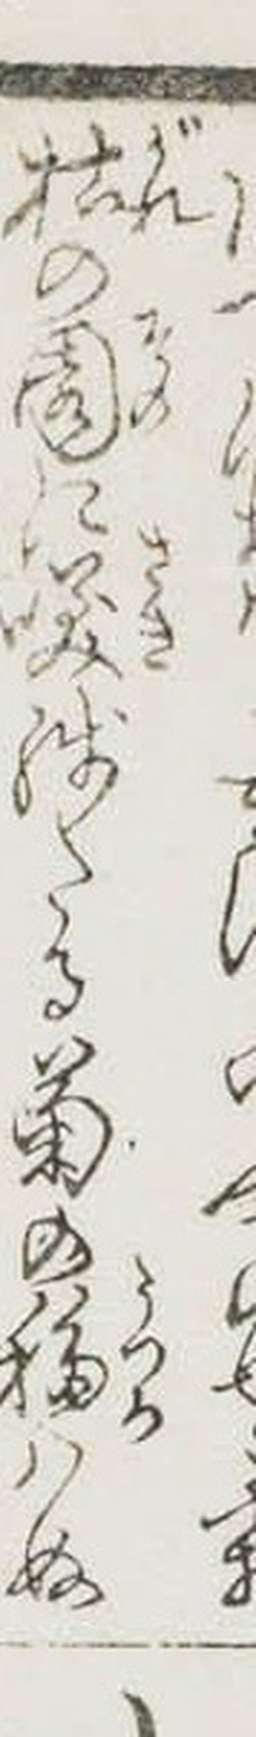枯の園に咲残たる菊の移はぬ
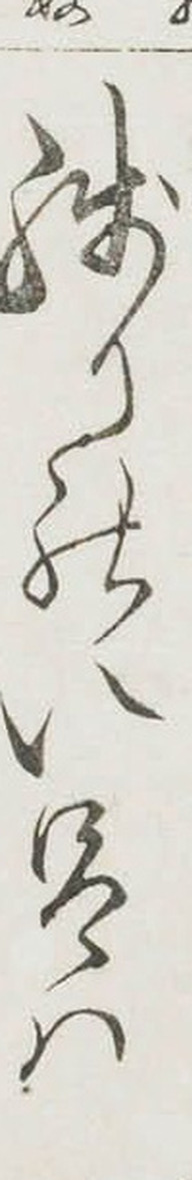残りのいろは
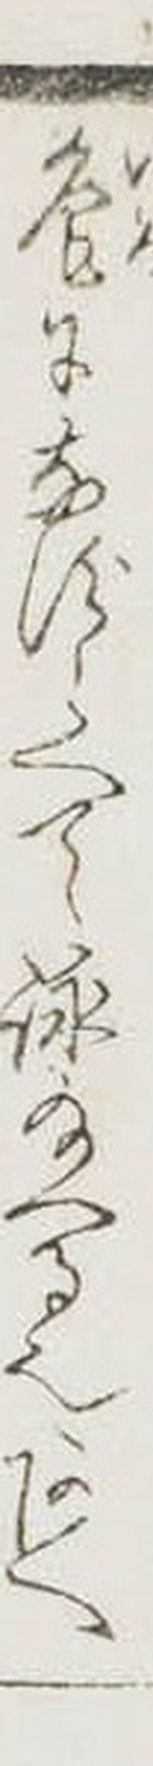色になずらへて詠給へる也あへ
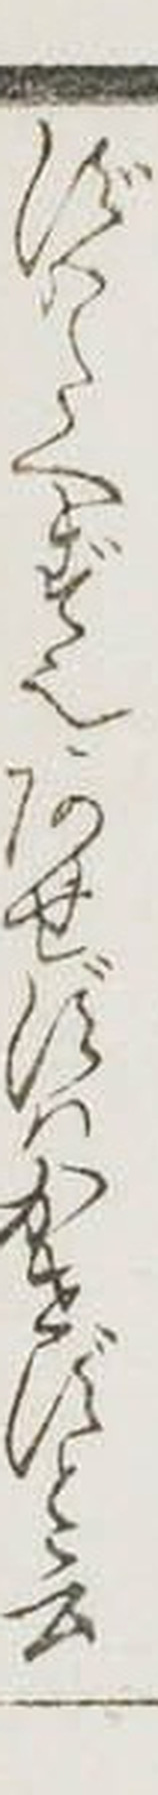ずはたへず也あせずはかせずと云
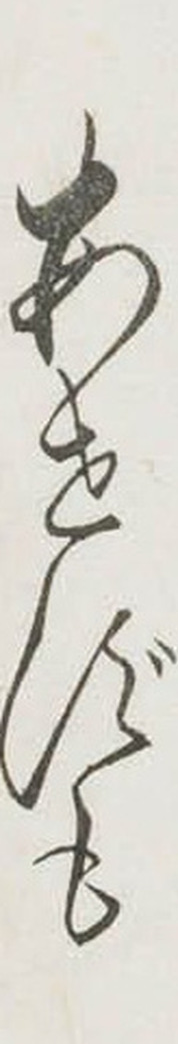あせずも
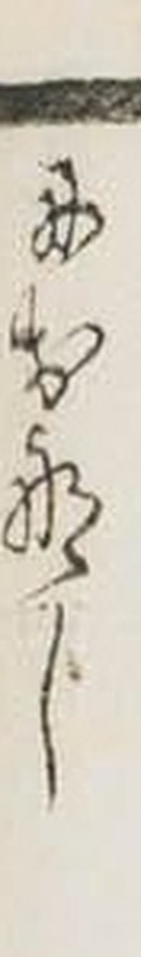におなじ
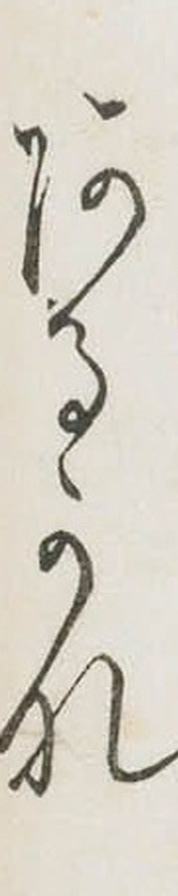あるかな
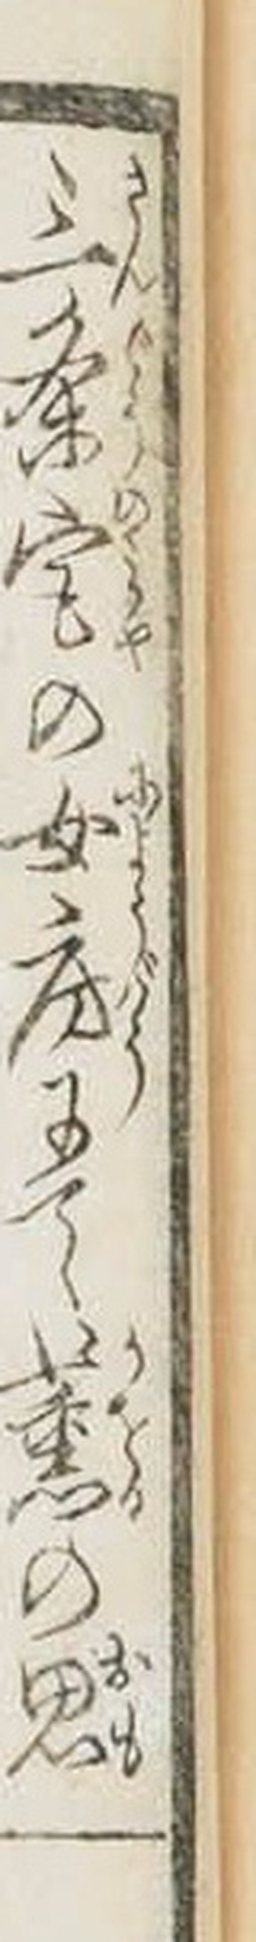三条宮の女房にて薫の思
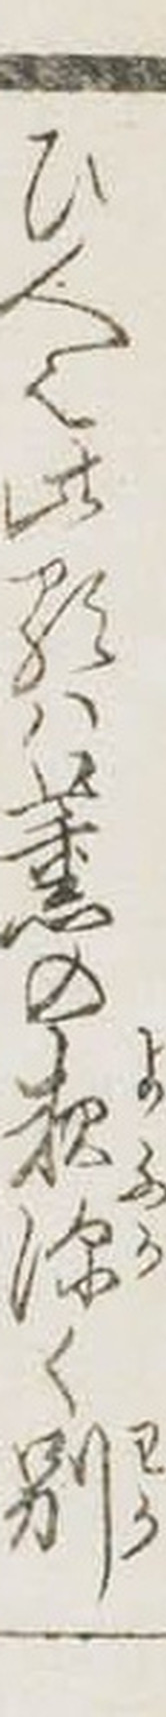ひ人なり此歌は薫の夜深く別
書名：源氏百人一首
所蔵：東京学芸大学教育コンテンツアーカイブ
